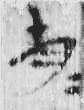十月
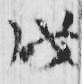戊
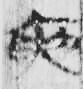寅
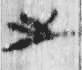之
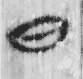日
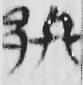𨚟（冬）
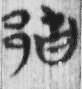邮
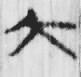大
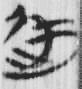○（屈）
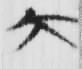大
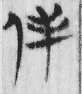仹
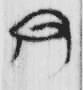尹
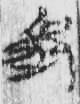○（夏）
